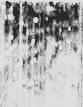株
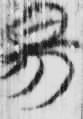昜（陽）
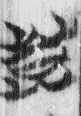莫
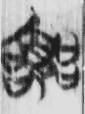囂
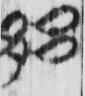郘
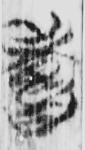壽
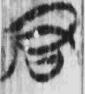君
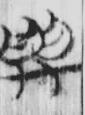與
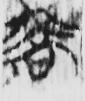喬
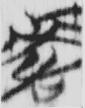差
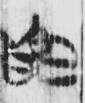爲
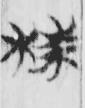株
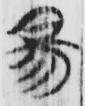昜（陽）
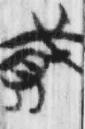貸
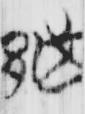○（越）
